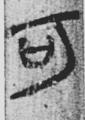可（何）
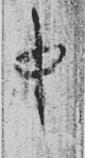中（仲）
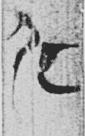尼
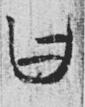曰
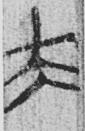夫
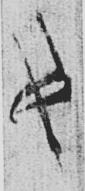民
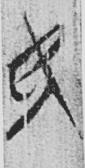𡚦
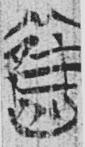舊
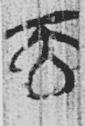而
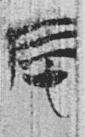○（塚）
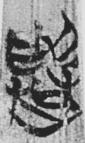○（舉）
